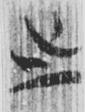之
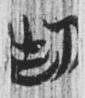廷
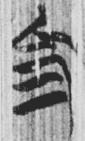命
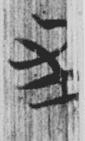求
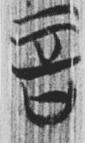言
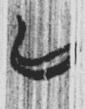㠯（以）
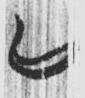㠯
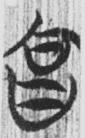合
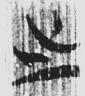之
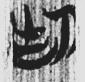廷
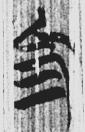命
